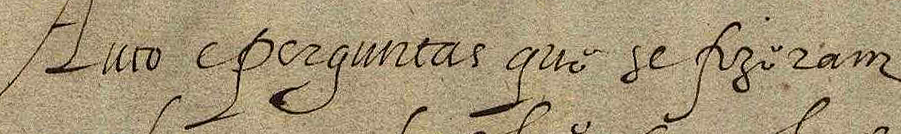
Auto e perguntas que se fizeram
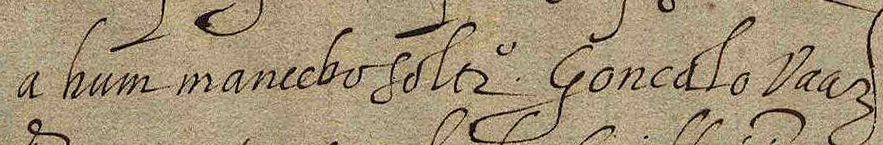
a hum mancebo soltro Goncalo Vaaz̄
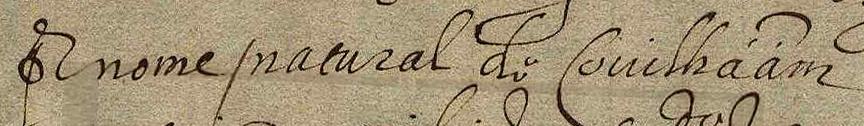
por nome natural de Couilhaãm
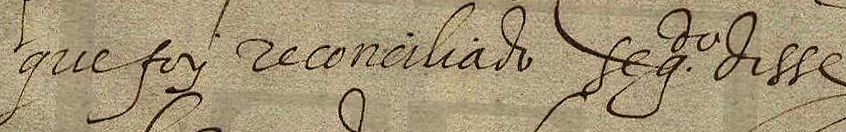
que foy reconciliado seg.do disse
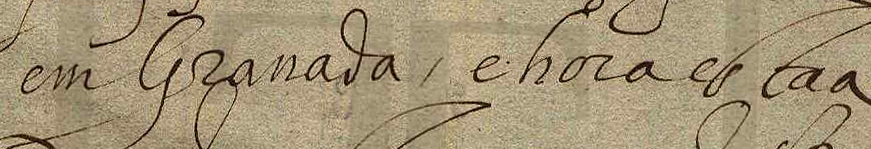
em Granada, e hora estaa
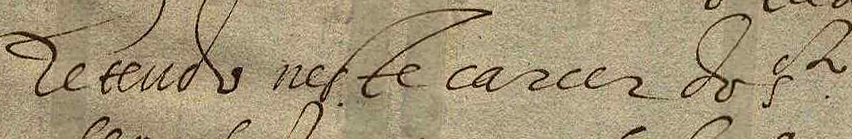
Reteudo neste carcer do scto.
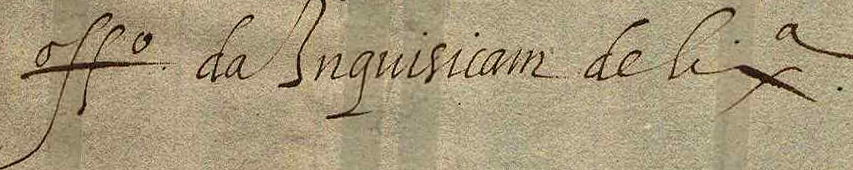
offo da Inquisiçam de lixa.
